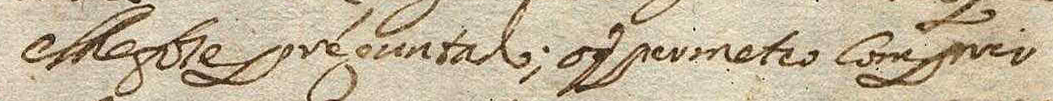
e lhe fose preguntado; o q̄ permeteo Comprir
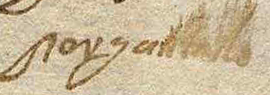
pergu_
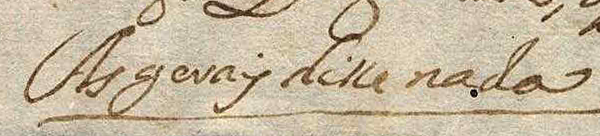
As gerais disse nada
